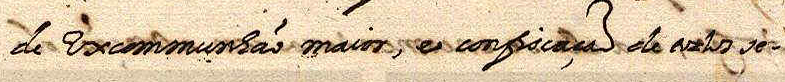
de Excomunhaõ maior, e confiscação de todos se
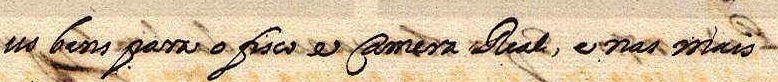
us bens para o fisco e Camera Real, e nas mais
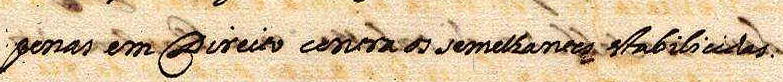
penas em Direito contra os semelhantes estabilicidas.
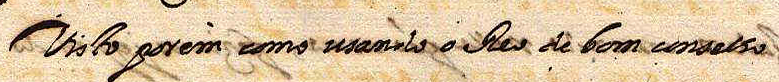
Visto porem como usando o Reo de bom conselho
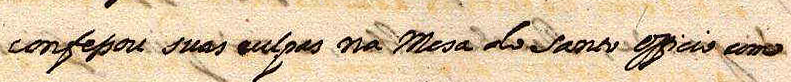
confessou suas culpas na Mesa do santo officio com
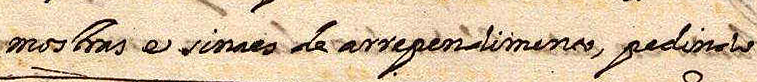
mostras e sinaes de arrependimento, pedindo
